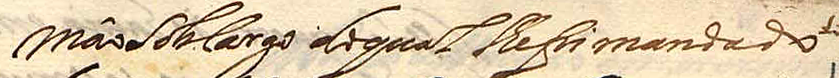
mão sob cargo do qual lhe foi mandado
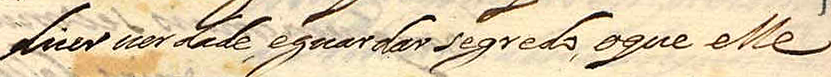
dizer uerdade, e guardar segredo, o que elle
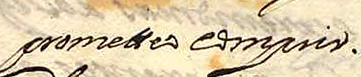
prometteo comprir.
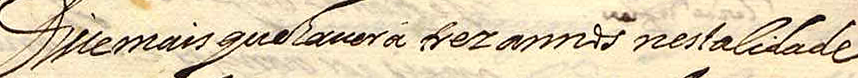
Disse mais que hauerá trez annos nesta Cidade
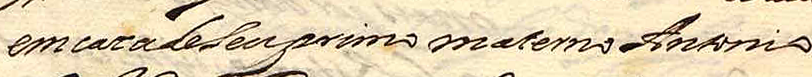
em caza de seu primo materno Antonio
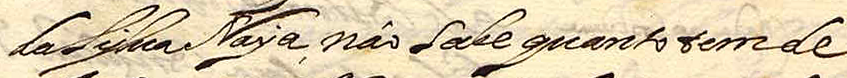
da Silua Naya, não sabe quanto tem de
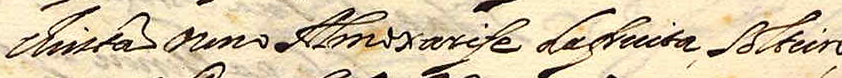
christaõ nouo Almoxarife da fruita, solteiro,
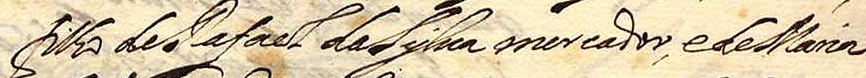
filho de Rafael da Silua mercador, e de Maria
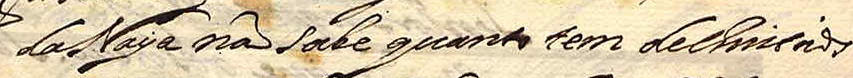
da Naya naõ sabe quanto tem de christaos
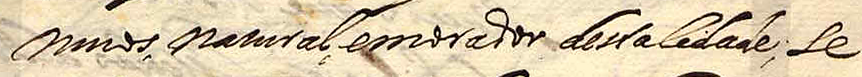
nouos, natural e morador desta Cidade, se
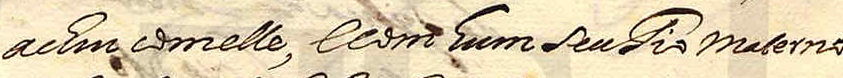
achou com elle, e com hum seu Tio materno
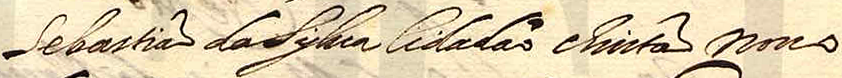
Sebastiaõ da Silua Cidadaõ christaõ nouo
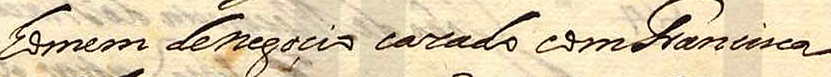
homem de negoçio cazado com Francisca
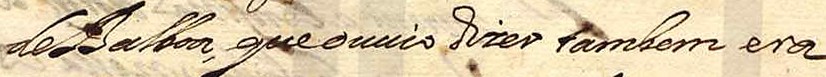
de Balboa, que ouuio dizer tambem era
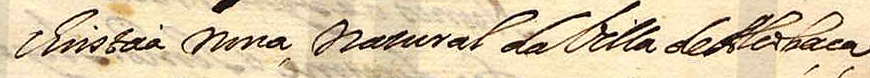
christaã noua, natural da Villa de Alcobaça,
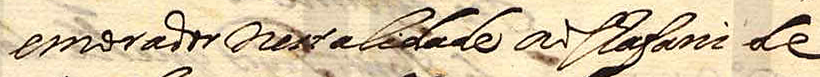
e morador nesta Cidade ao Chafariz de
